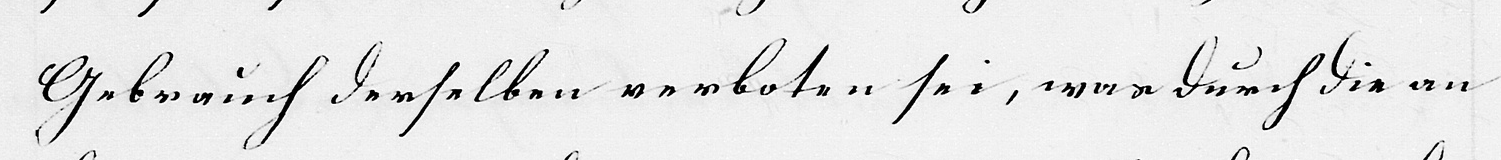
Gebrauch derselben verboten sei, was durch die an
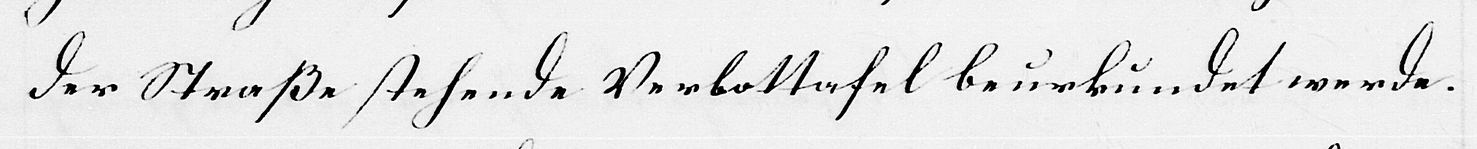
der Straße stehende Verbottafel beurkundet werde.
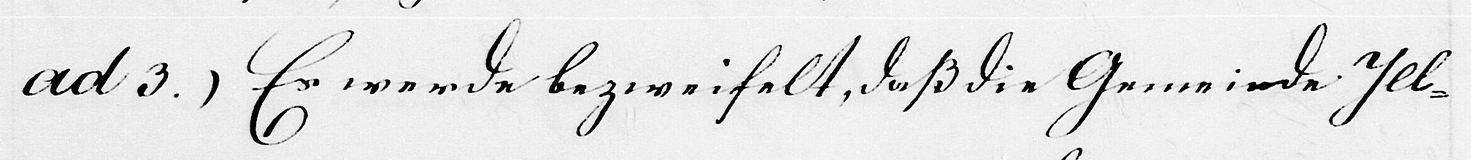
ad 3.) Es werde bezweifelt, daß die Gemeinde Ill¬
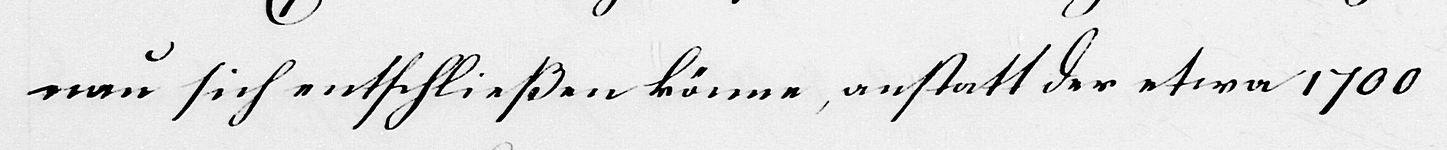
nau sich entschließen könne, anstatt der etwa 1700
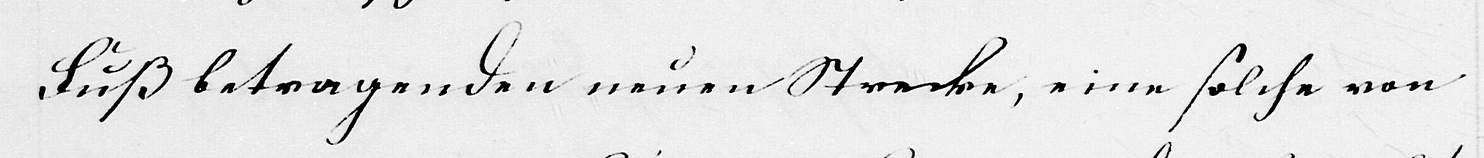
Fuß betragenden neuen Strecke, eine solch von
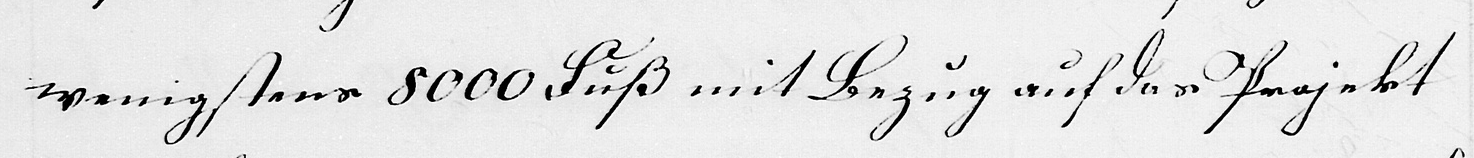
wenigstens 8000 Fuß mit Bezug auf das Projekt
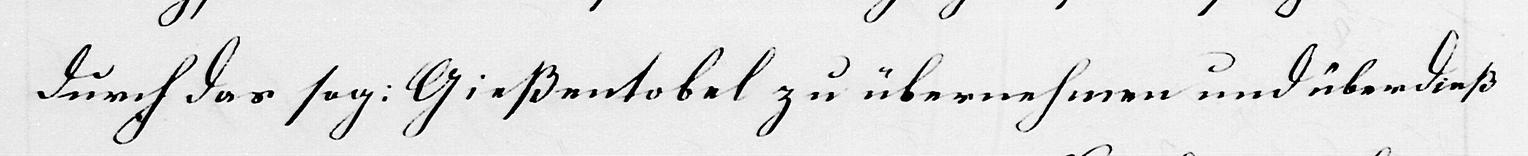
durch das sog: Gießentobel zu übernehmen und überdieß
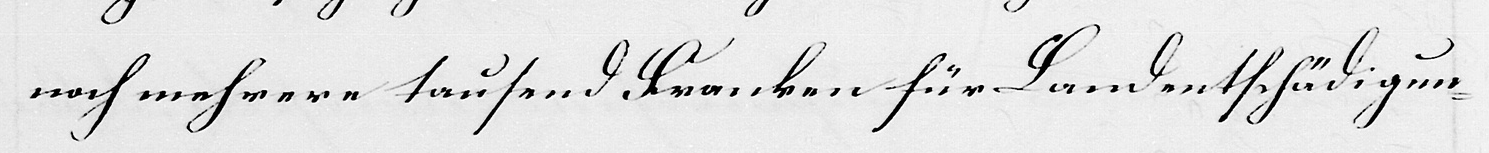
noch mehrere tausend Franken für Landentschädigun¬
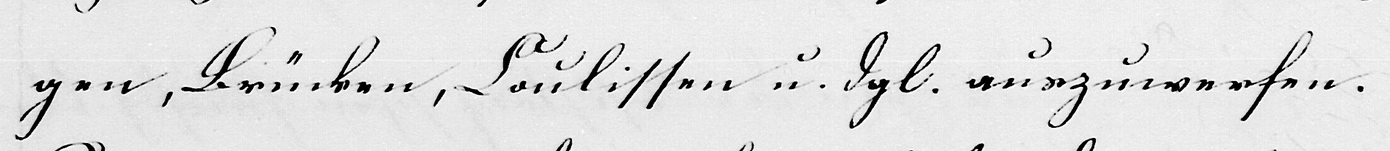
gen, Brücken, Coulissen u. dgl. auszuwerfen.
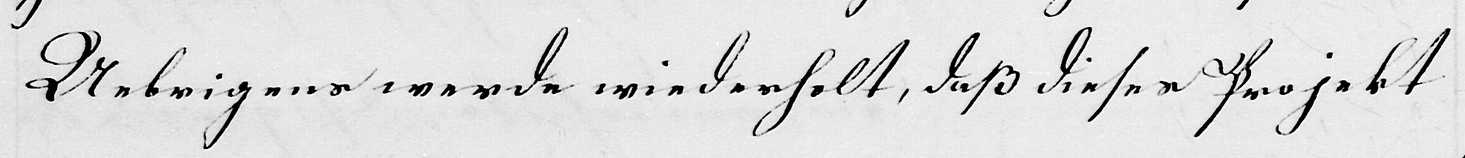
Uebrigens werde wiederholt, daß dieses Projekt
